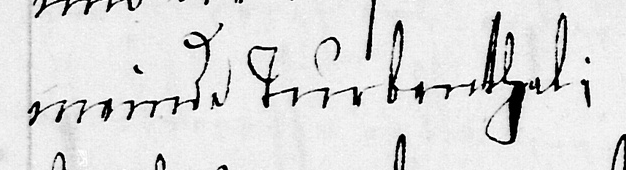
meinde Turbenthal;
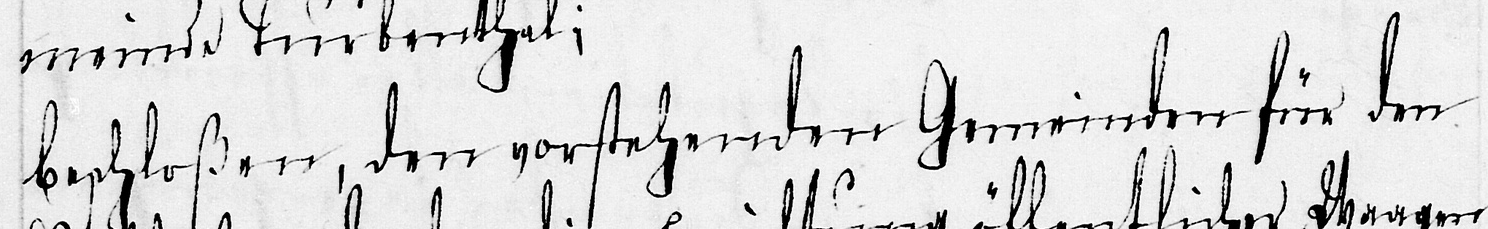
beschloßen, den vorstehenden Gemeinden für den
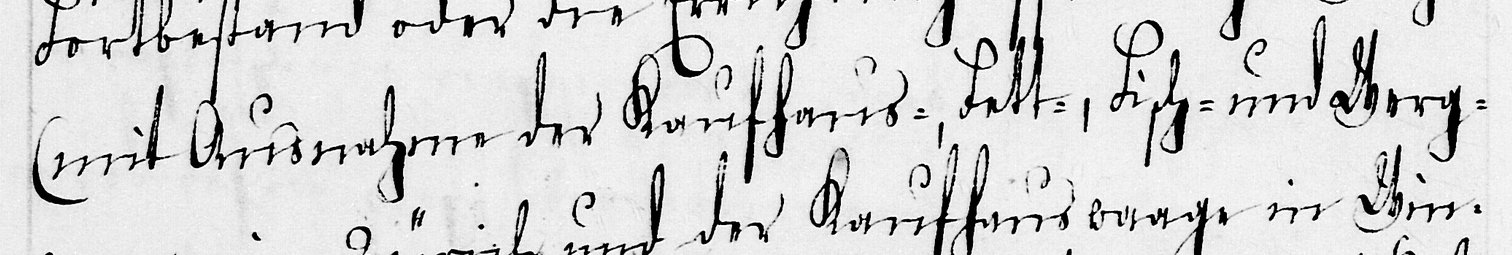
(mit Ausnahme der Kaufhaus-, Fett-, Fisch- und Werg¬
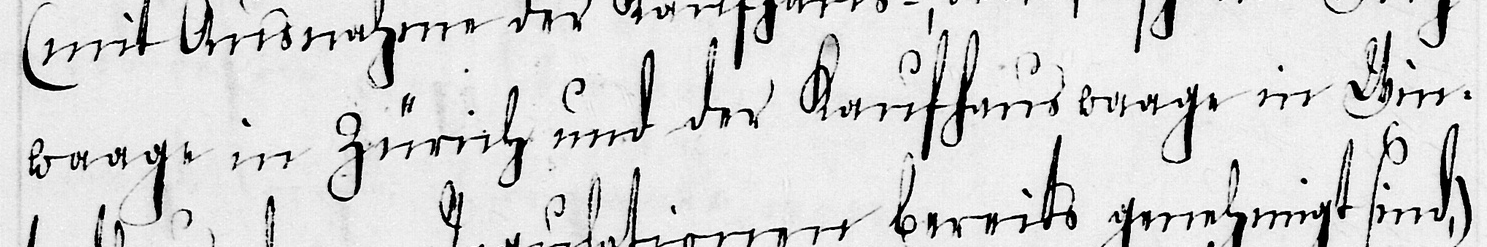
waage in Zürich und der Kaufhauswaage in Win¬
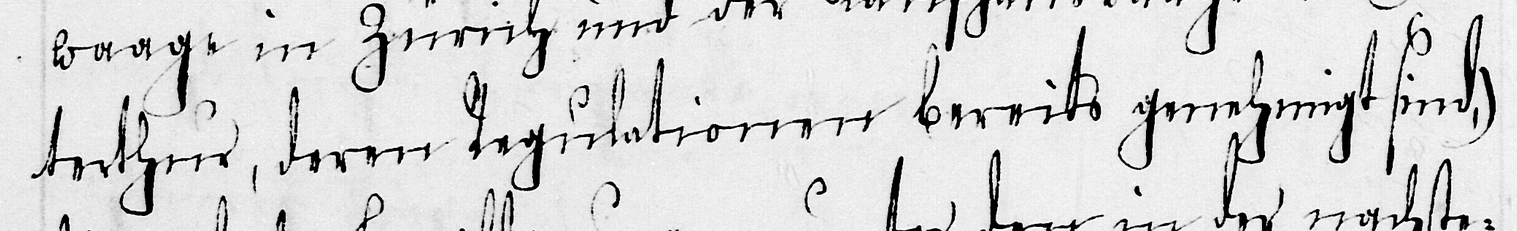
terthur, deren Regulationen bereits genehmigt sind,)
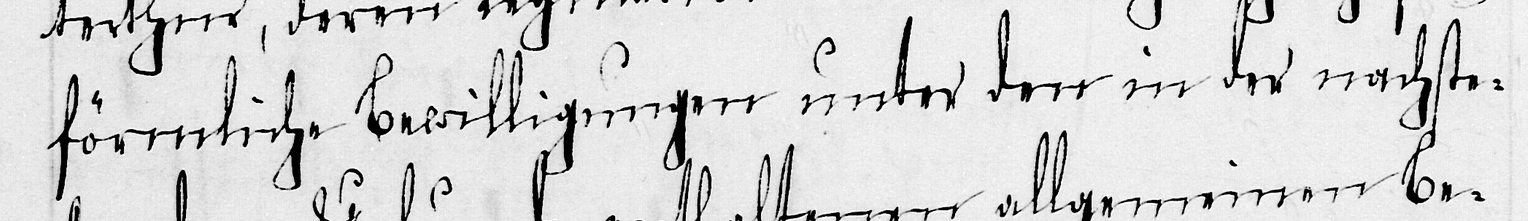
förmliche Bewilligungen unter den in der nachste¬
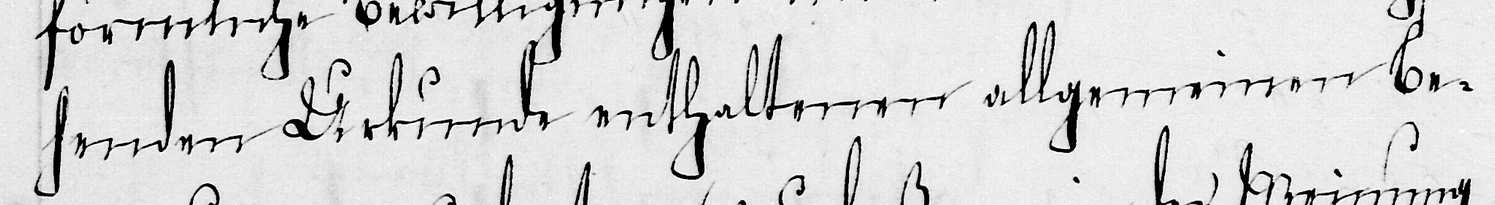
henden Urkunde enthaltenen allgemeinen Be¬
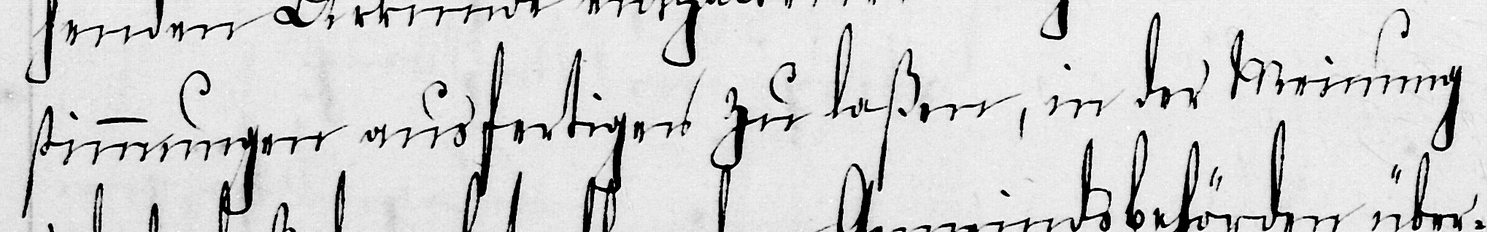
stimmungen ausfertigen zu laßen, in der Meinung
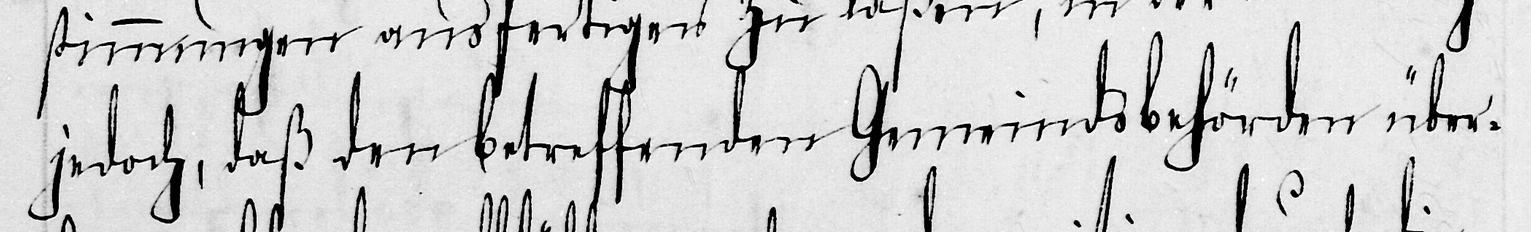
jedoch, daß den betreffenden Gemeindsbehörden über¬
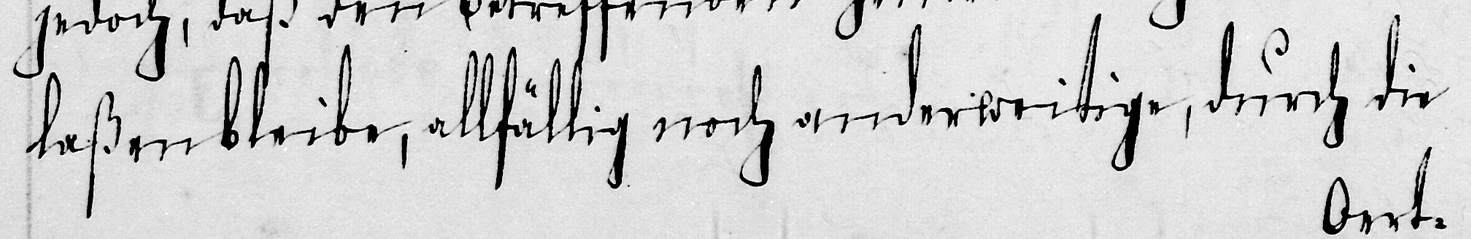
laßen bleibe, allfällig noch anderweitige, durch die
